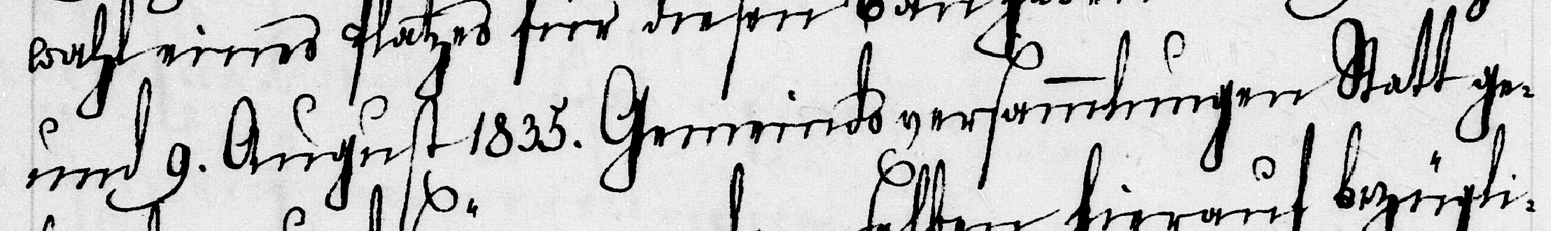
und 9. August 1835. Gemeindsversammlungen Statt ge¬
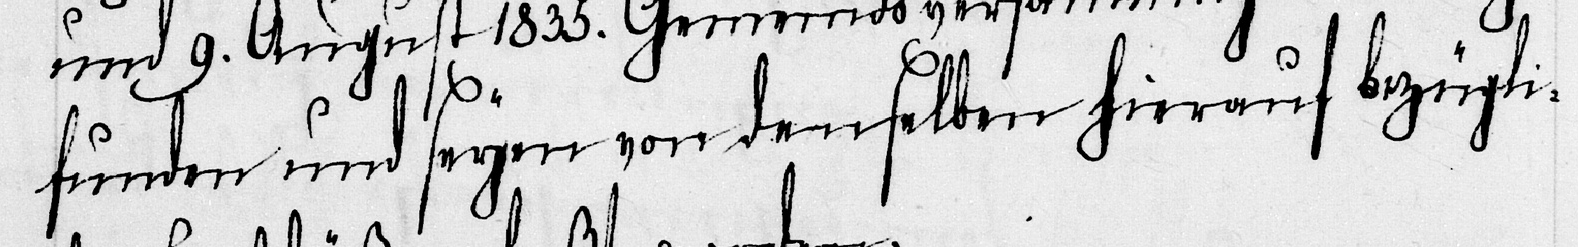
funden und seyen von denselben hierauf bezügli¬
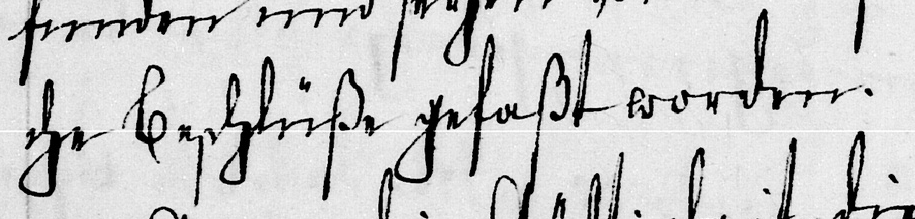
che Beschlüße gefaßt worden.
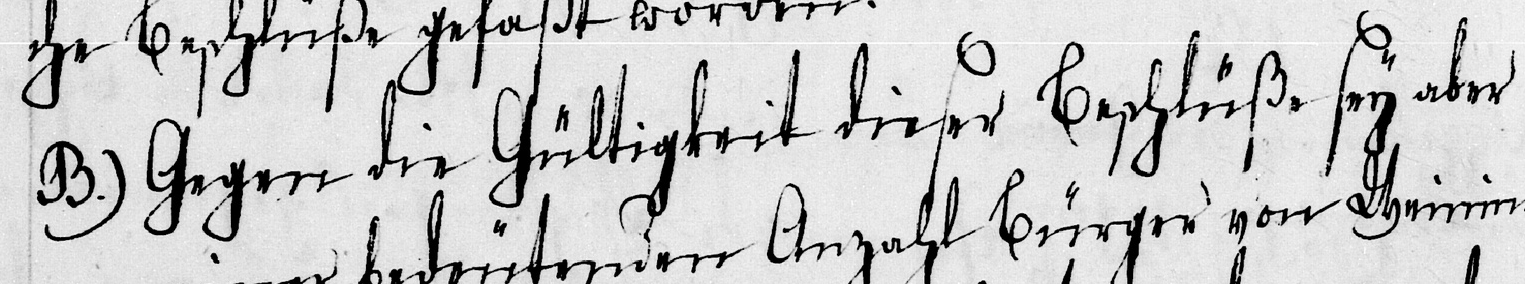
B.) Gegen die Gültigkeit dieser Beschlüße sey aber
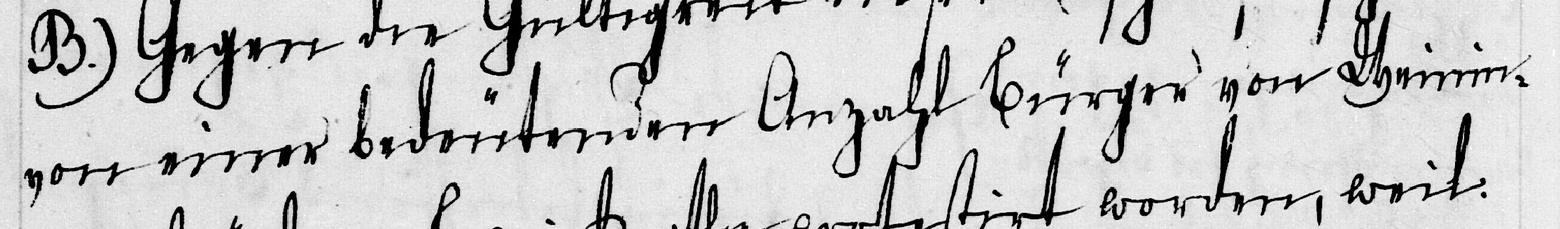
von einer bedeutenden Anzahl Bürger von Weinin¬
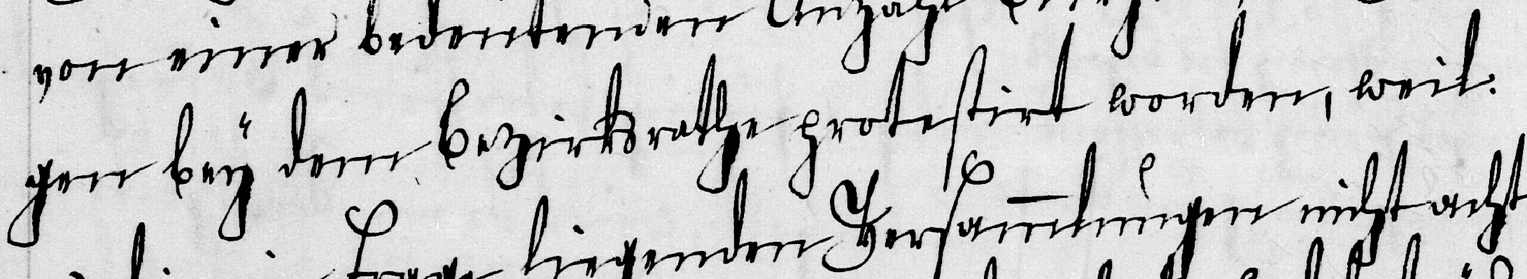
gen bey dem Bezirksrathe protestirt worden, weil:
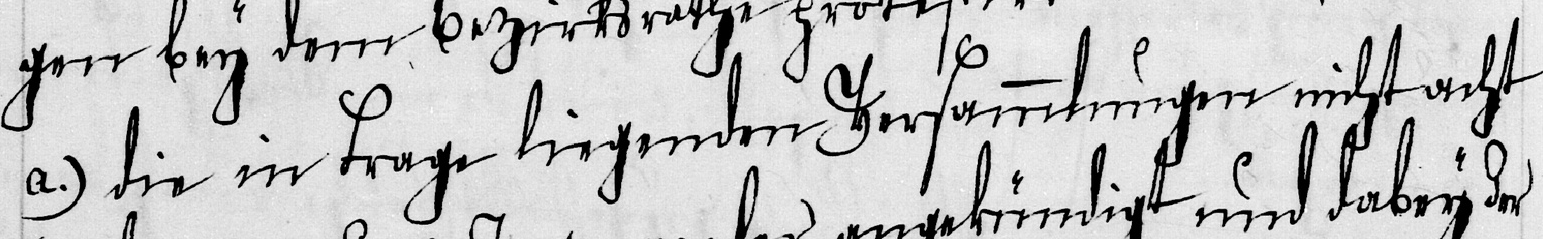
a.) die in Frage liegenden Versammlungen nicht acht
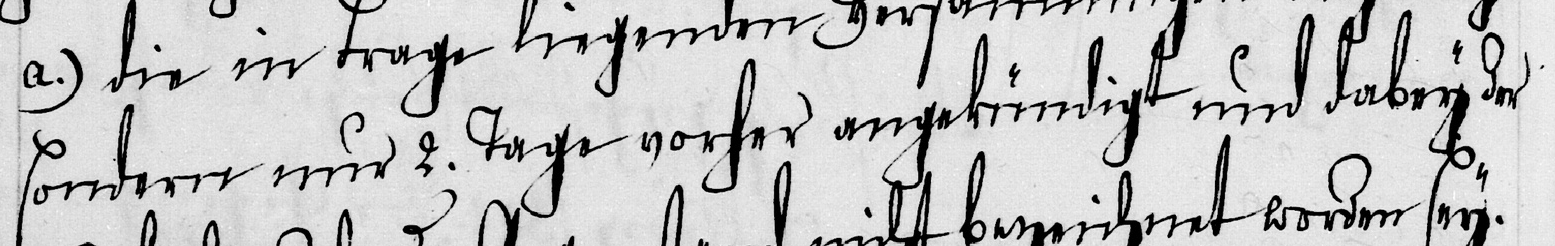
sonder nur 2. Tage vorher angekündigt und dabey der
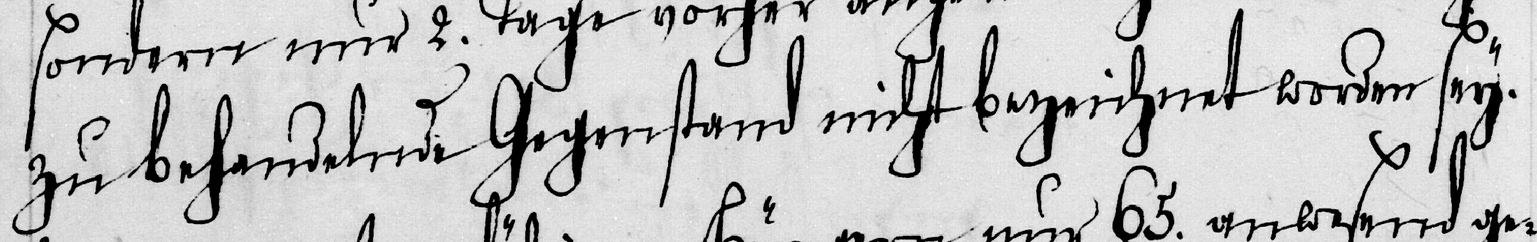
zu behandelnde Gegenstand nicht bezeichnet worden sey.
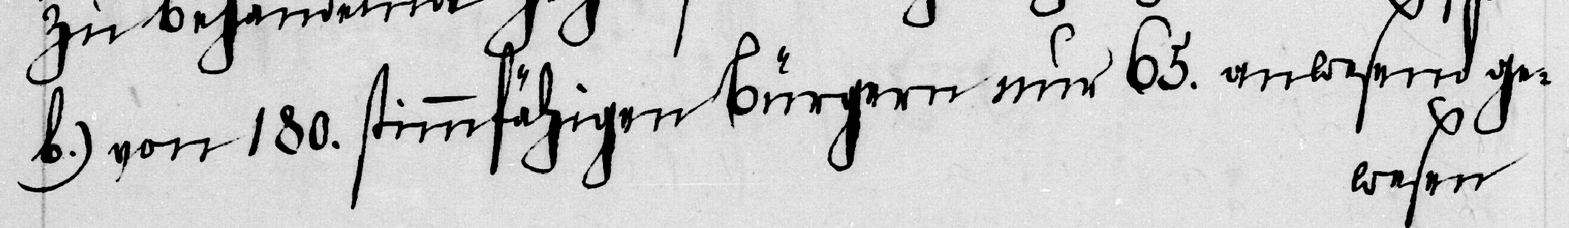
b.) von 180. stimmfähigen Bürgern nur 65. anwesend ge-
